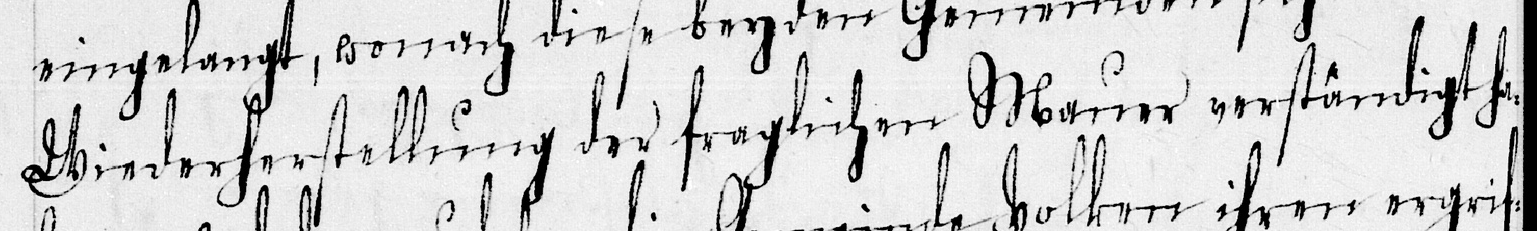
Wiederherstellung der fraglichen Mauer verständigt h¬
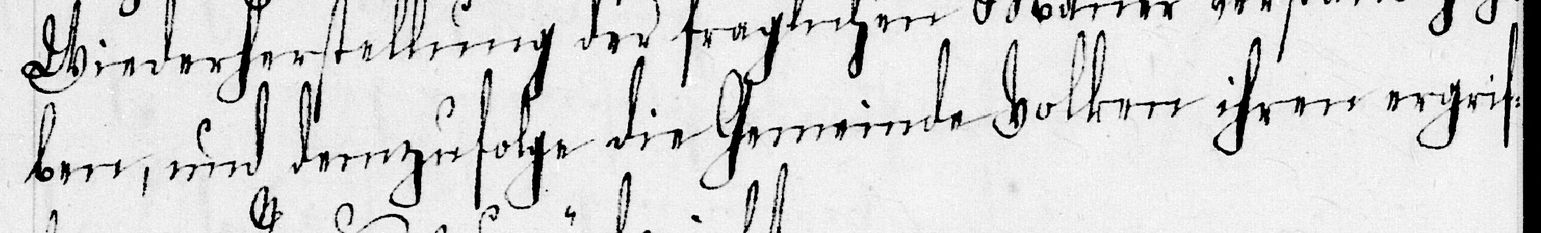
aben, und demzufolge die Gemeinde Volken ihren ergri¬
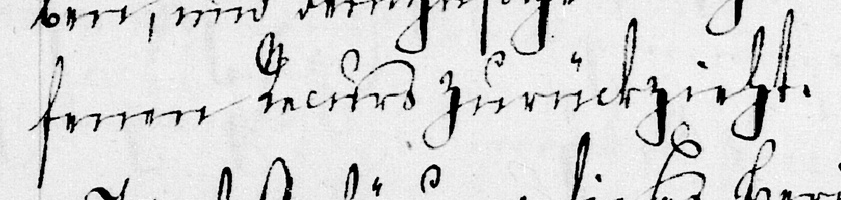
fenen Recurs zurückzieht.
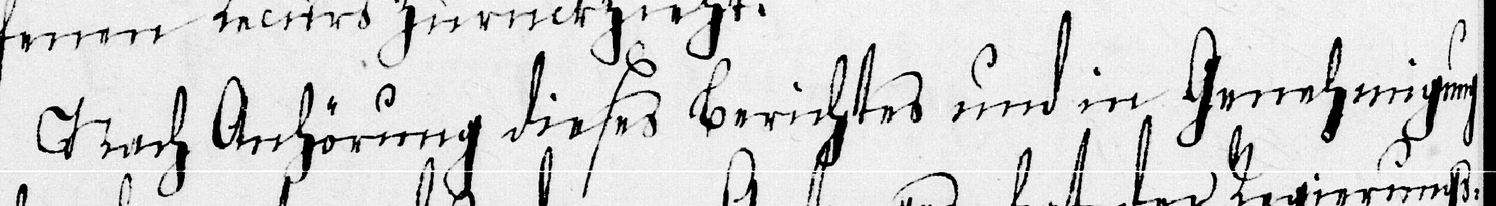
Nach Anhörung dieses Berichtes und in Genehmigung
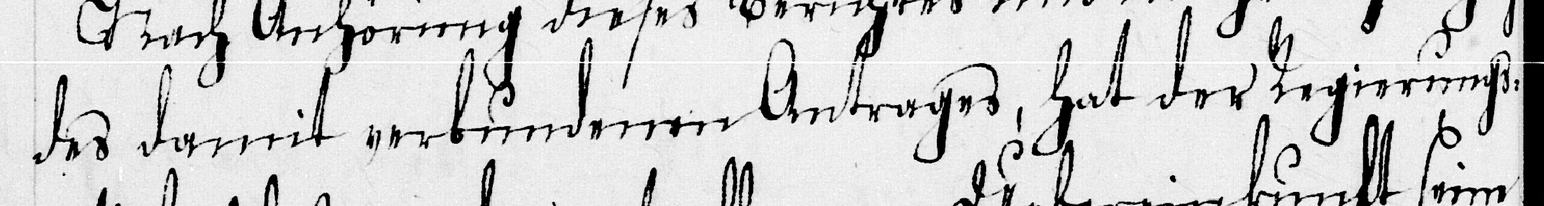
des damit verbundenen Antrages, hat der Regierungs¬
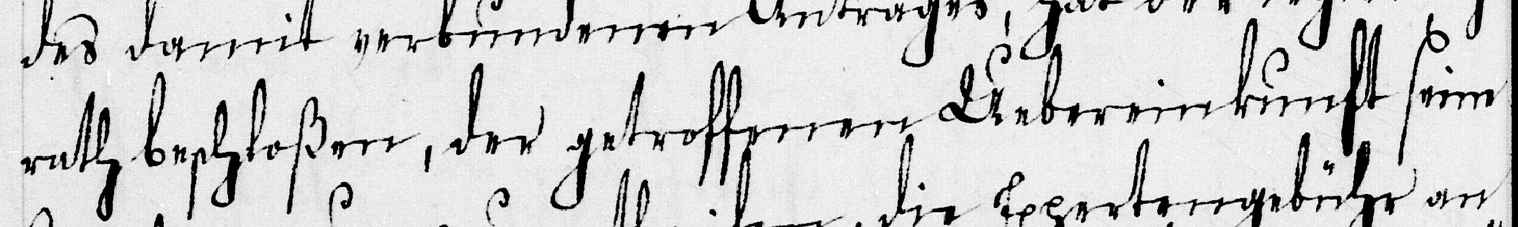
rath beschloßen, der getroffenen Uebereinkunft seine
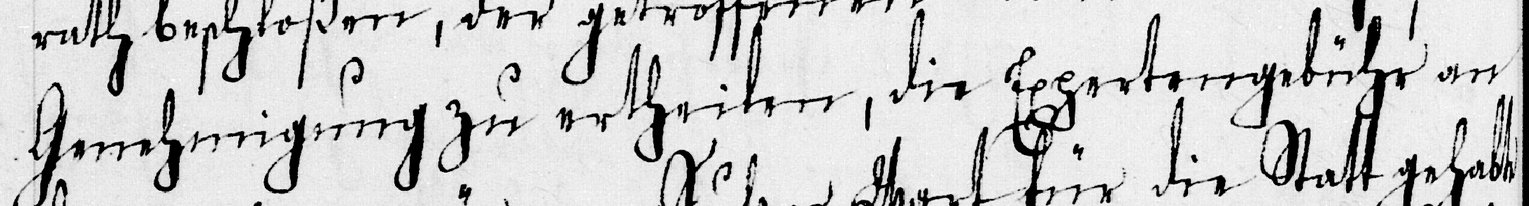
Genehmigung zu ertheilen, die Expertengebühr an
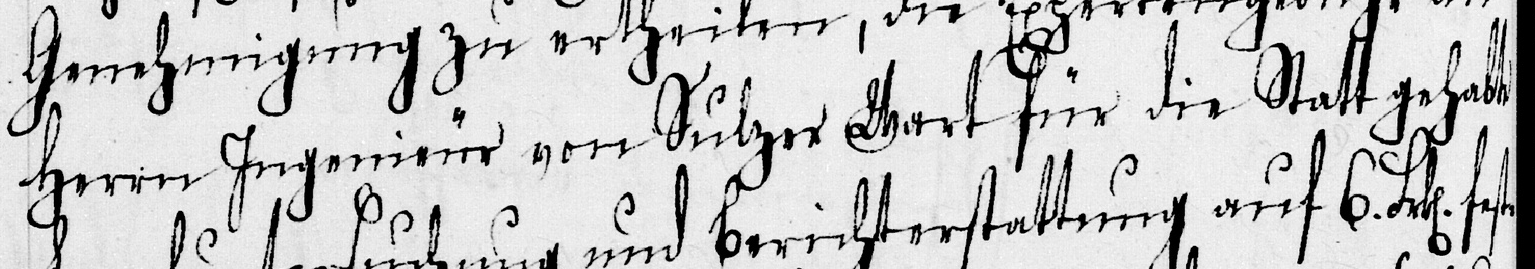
Herrn Ingenieur von Sulzer Wart für die Statt gehabte
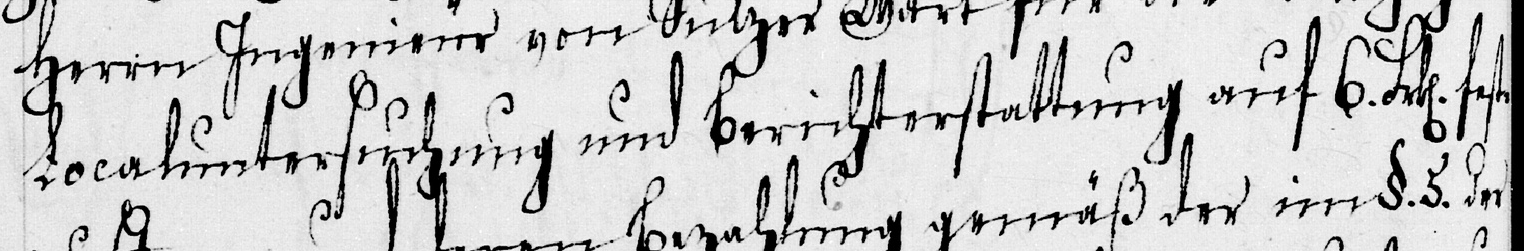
Localuntersuchung und Berichterstattung auf 6. Frk[e¬
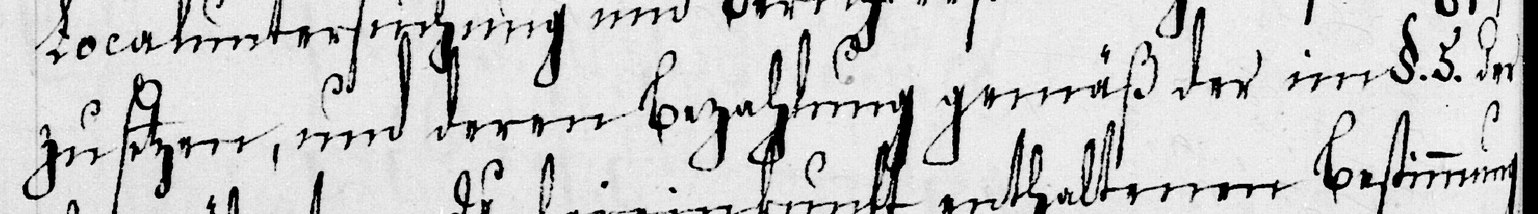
tzusetzen, und deren Bezahlung gemäß der im §. 5. der
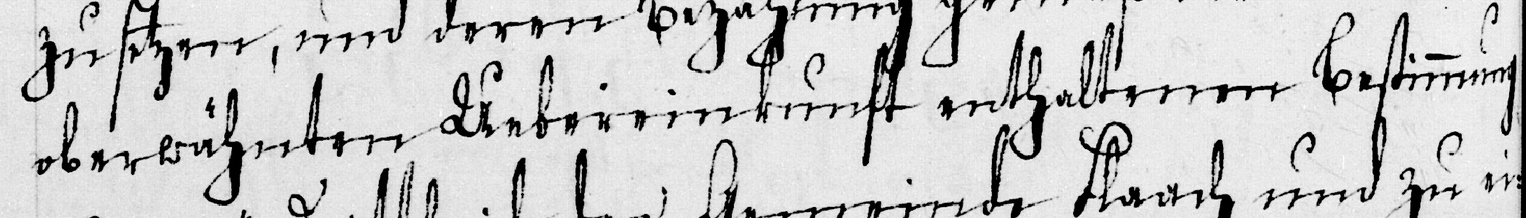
oberwähnten Uebereinkunft enthaltenen Bestimmung
